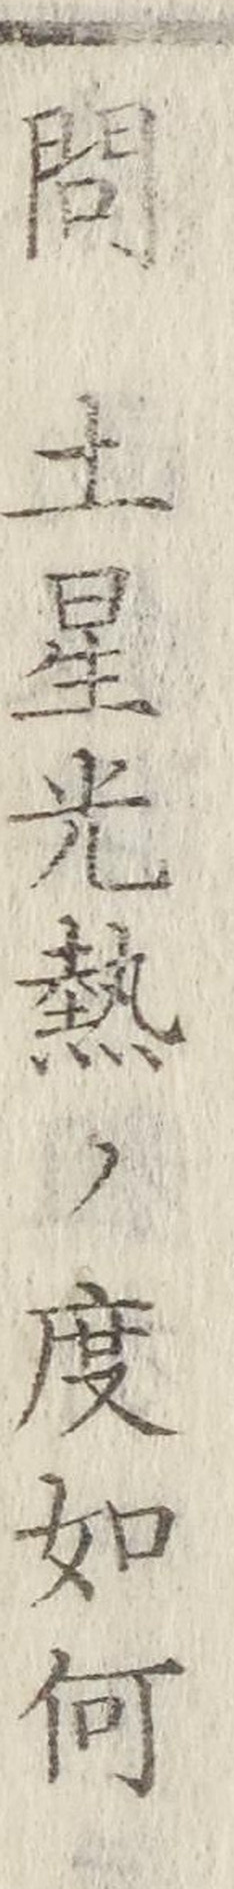問土星光熱ノ度如何
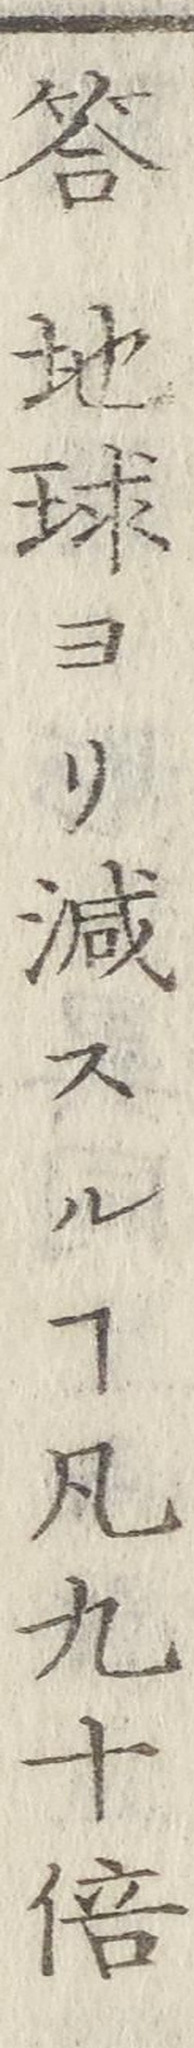答地球ヨリ減スルコト凡九十倍
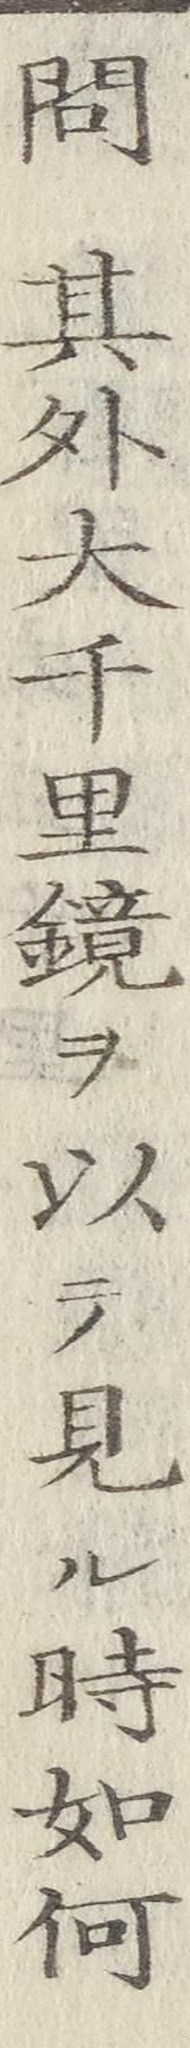問其外大千里鏡ヲ以テ見ル時如何
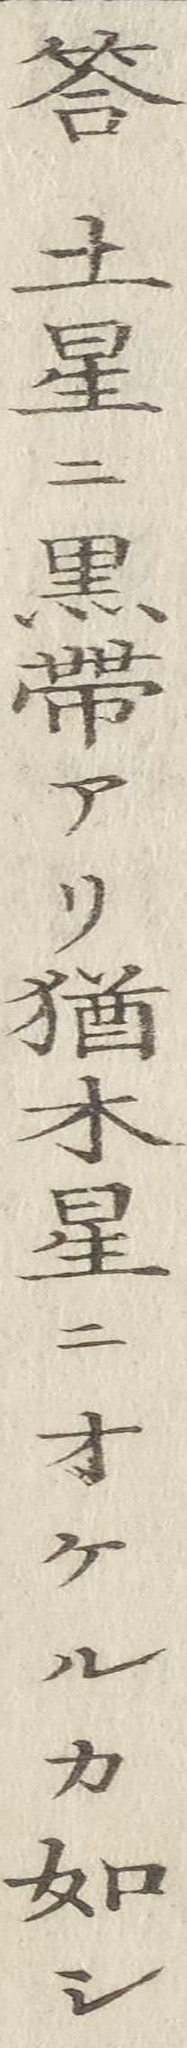答土星ニ黒帯アリ猶木星ニオケルカ如シ
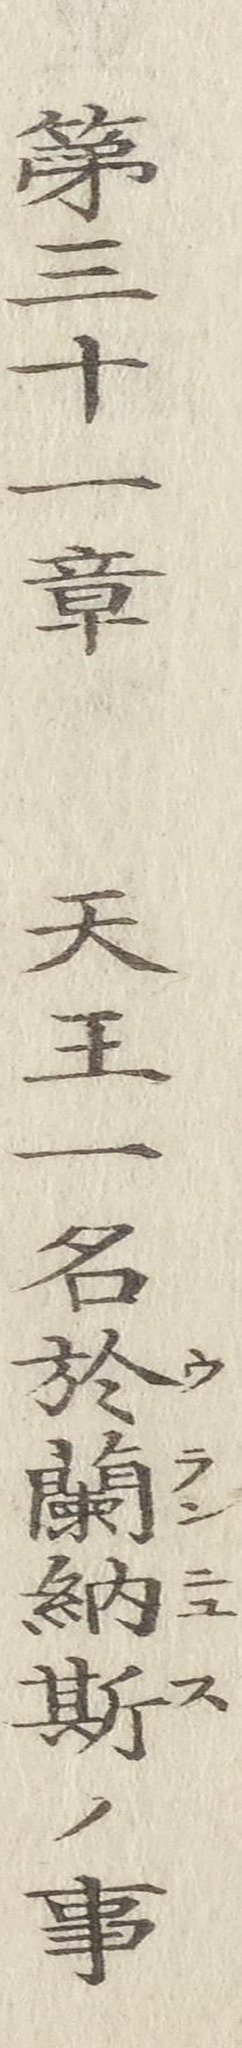第三十一章天王一名於蘭納斯ノ事
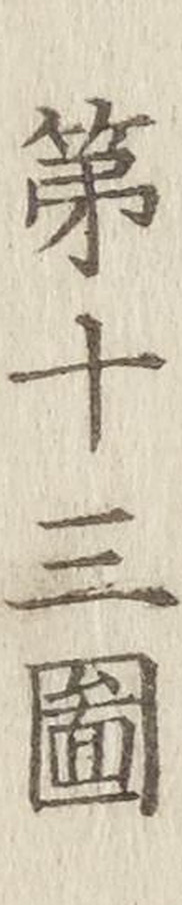第十三図
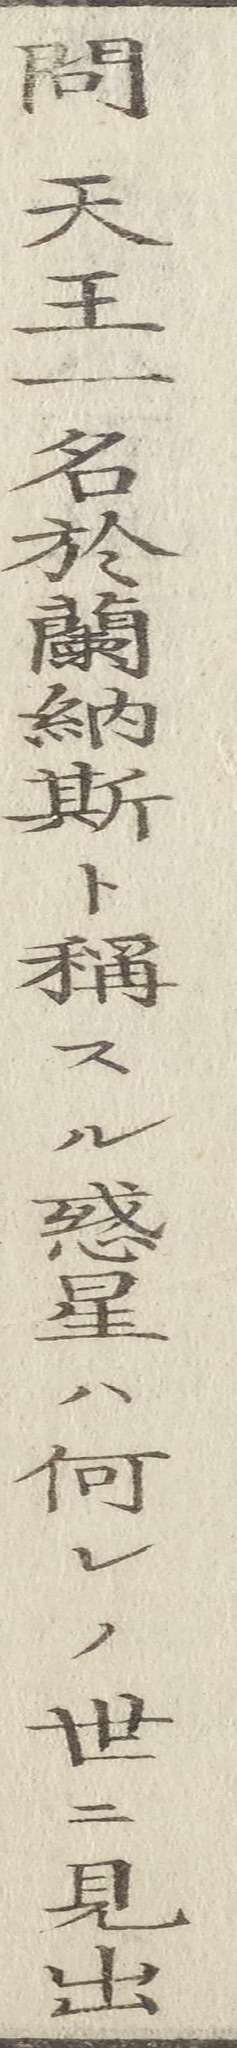問天王一名於蘭納斯ト称スル惑星ハ何レノ世ニ見出
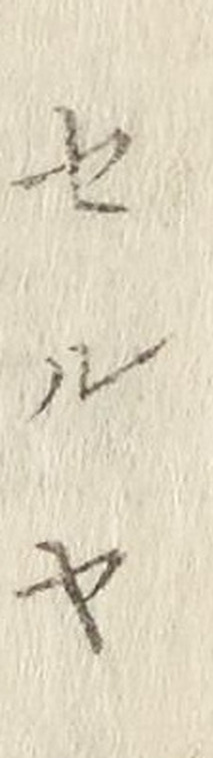セルヤ
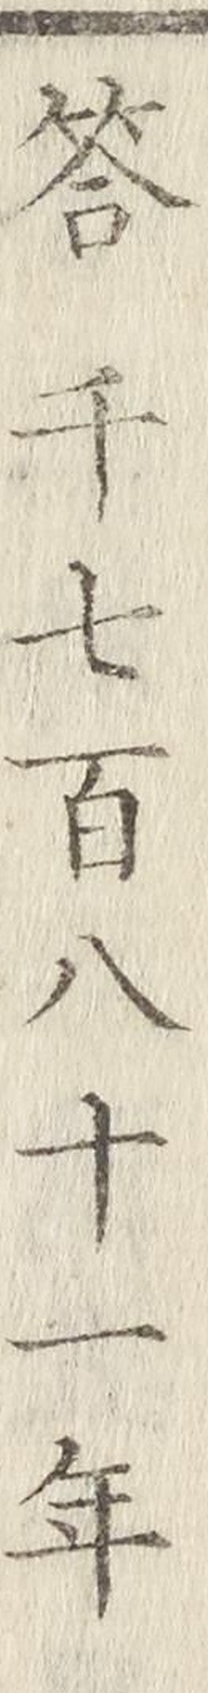答千七百八十一年
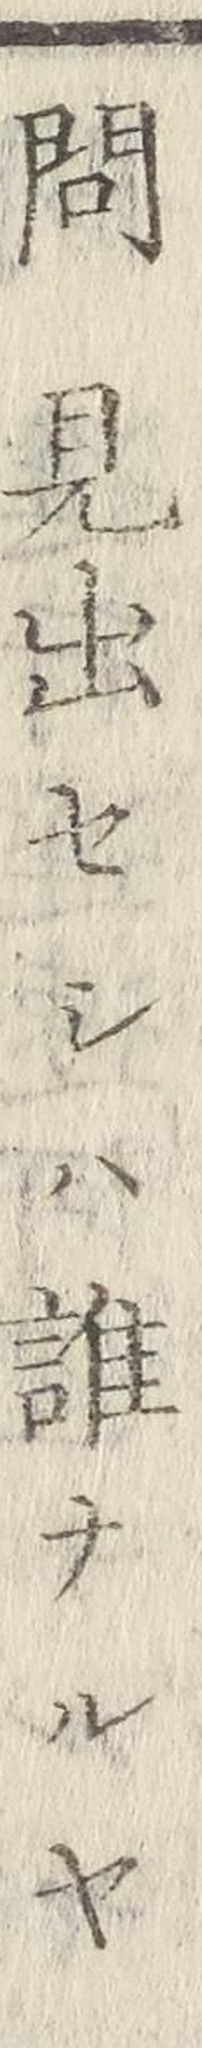問見出セシハ誰ナルヤ
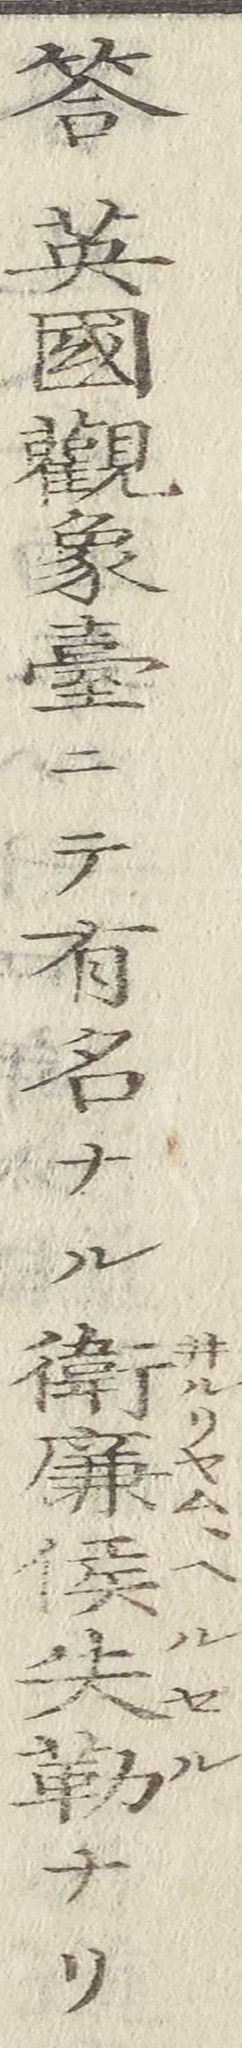答英国観象台ニテ有名ナル衛廉侯失勒ナリ
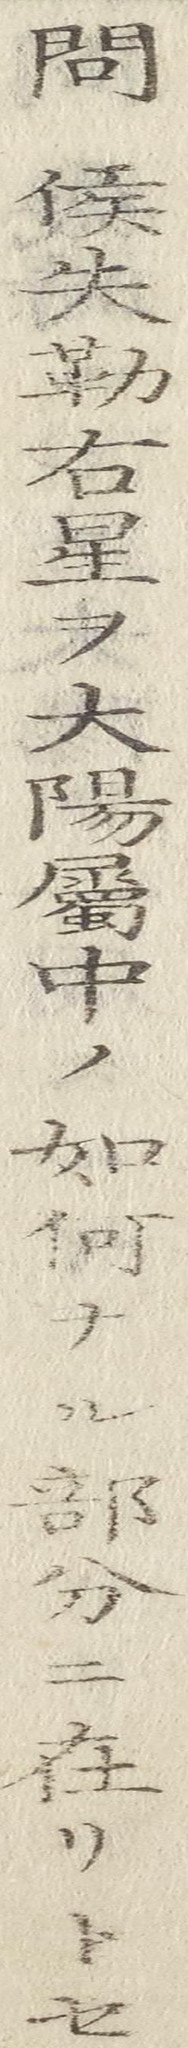問侯失勒右星ヲ大陽属中ノ如何ナル部分ニ在リトセ
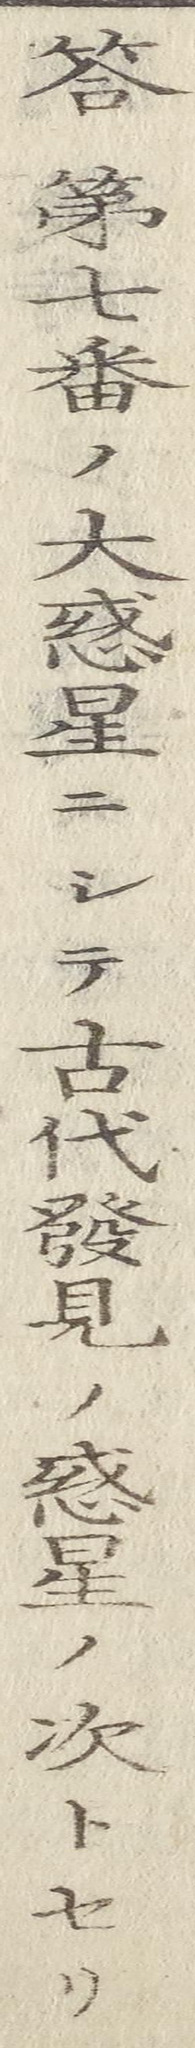答第七番ノ大惑星ニシテ古代発見ノ惑星ノ次トセリ
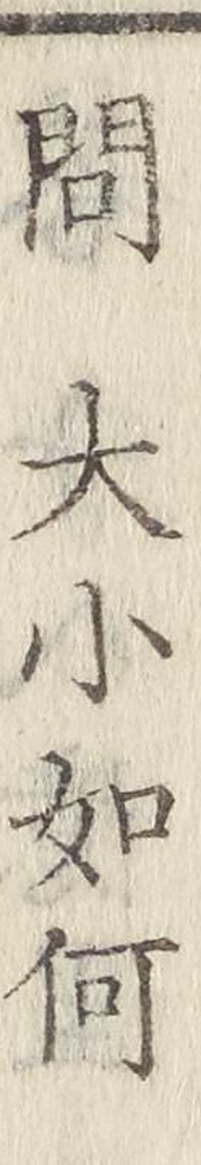問大小如何
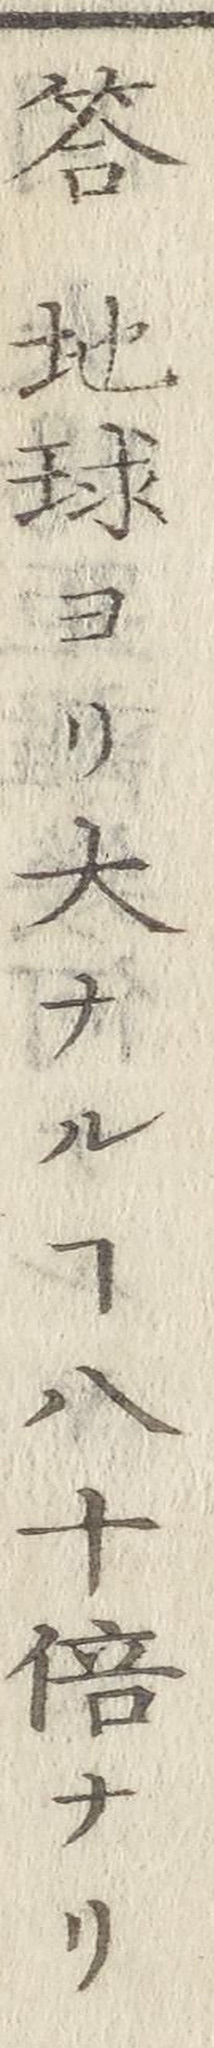答地球ヨリ大ナルコト八十倍ナリ
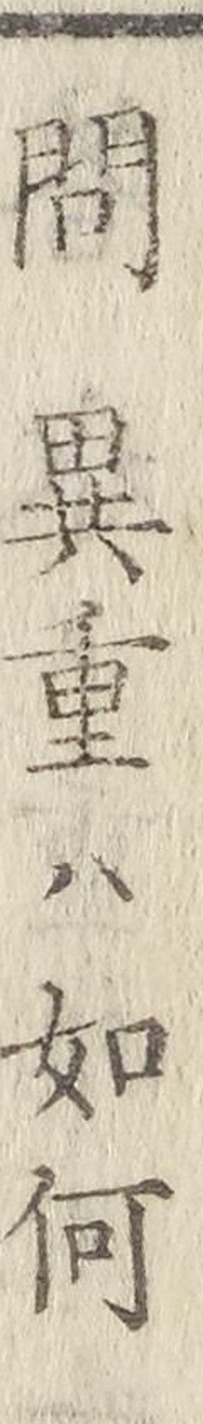問異重ハ如何
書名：星学圖説　下
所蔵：東京大学地震研究所図書室 Earthquake Research Institute Library, The University of Tokyo, JAPAN
